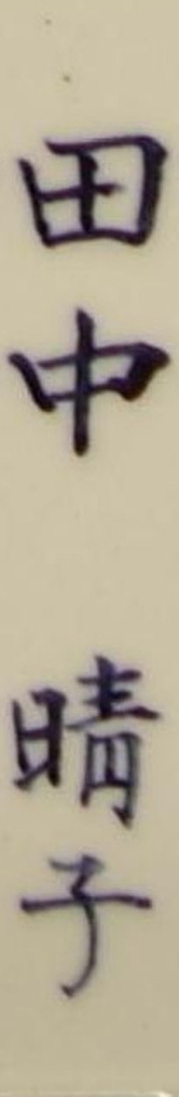田中晴子
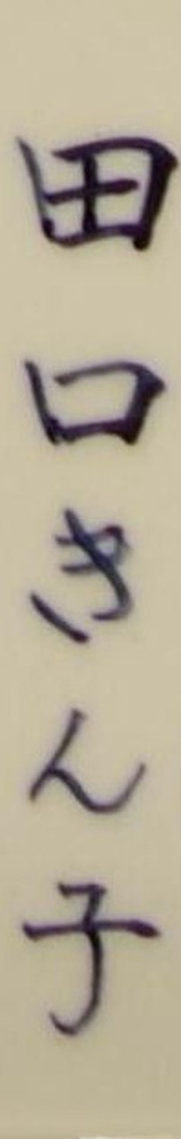田口きん子
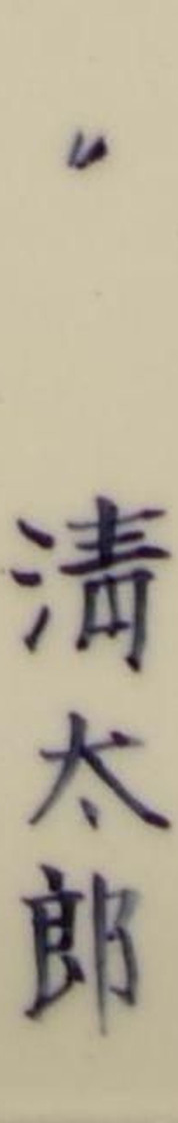清太郎
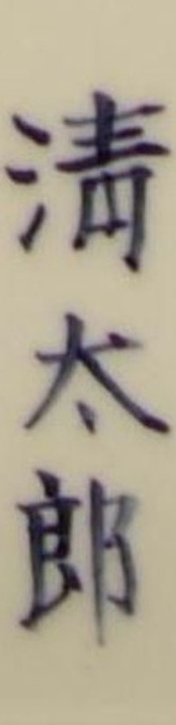清太郎
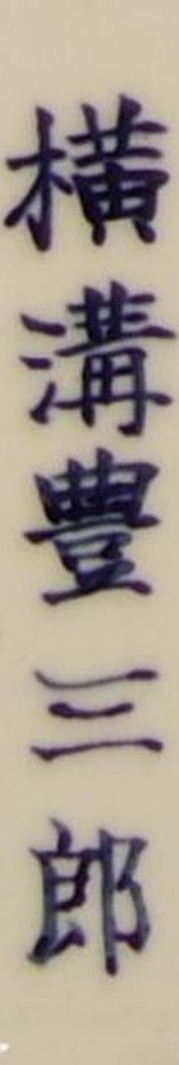横溝豊三郎
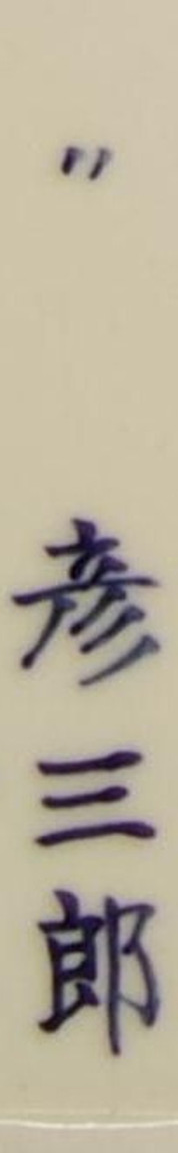彦三郎
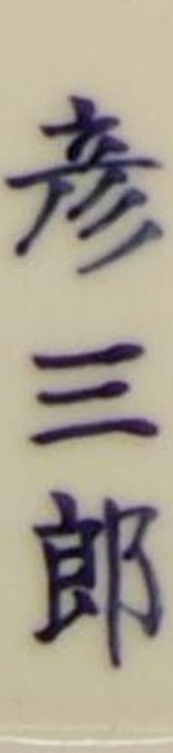彦三郎
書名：A~D
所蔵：koyasan kongobuji
